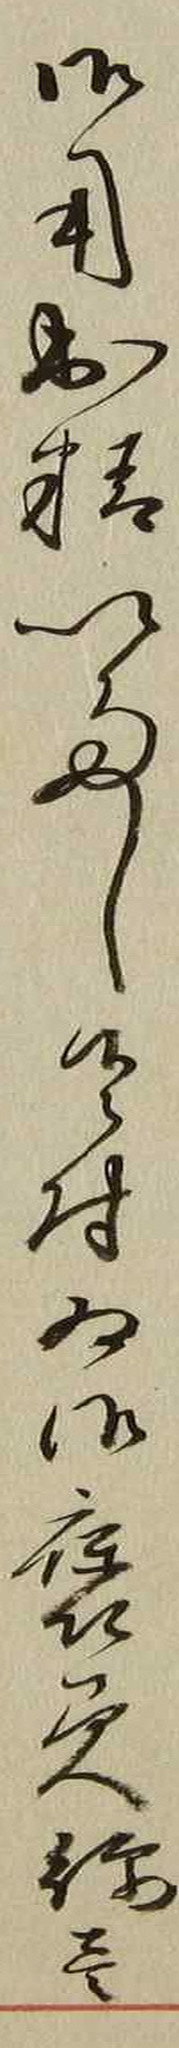御用出精いたし候に付為御褒美綿壱
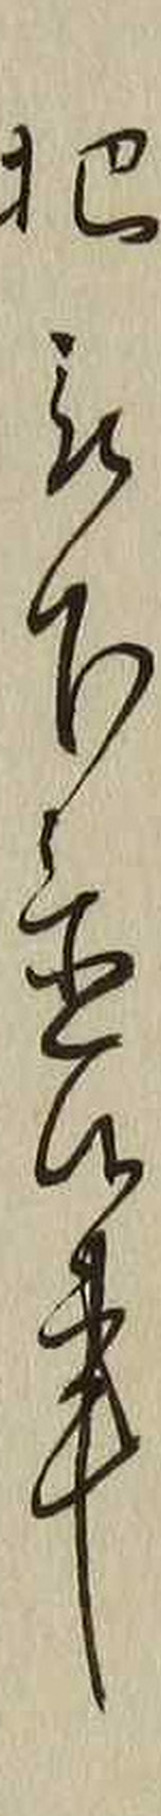把被下置候事
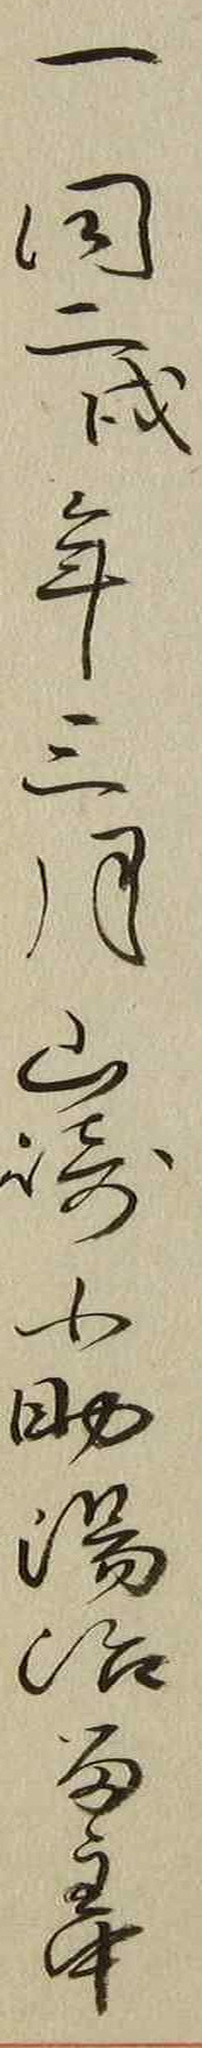一同二戌年三月山崎小助湯治留主中
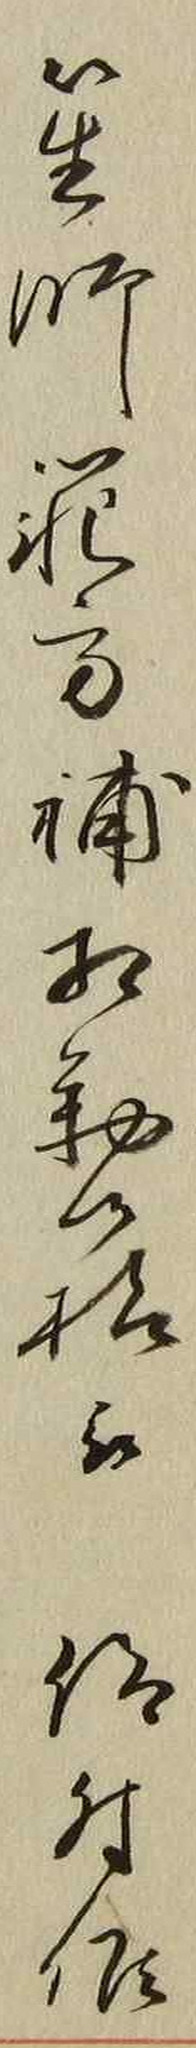笙師範方補相勤候様被仰付候
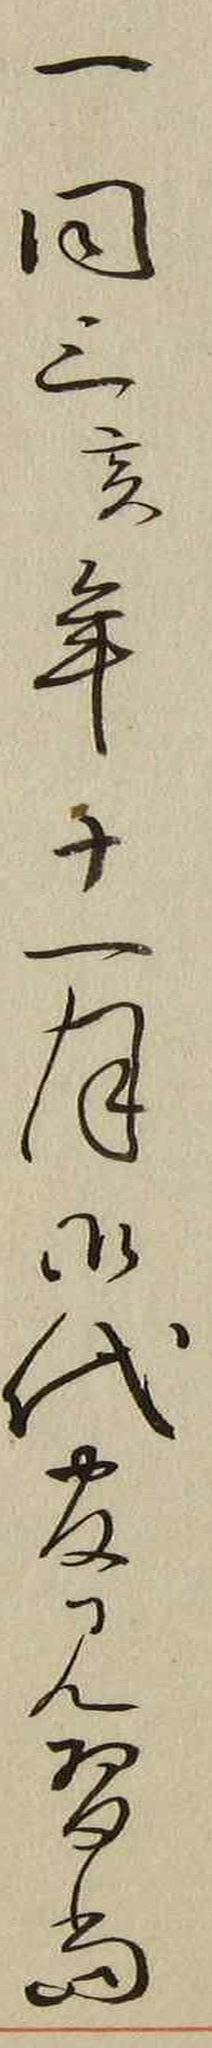一同三亥年十一月御代官見習当
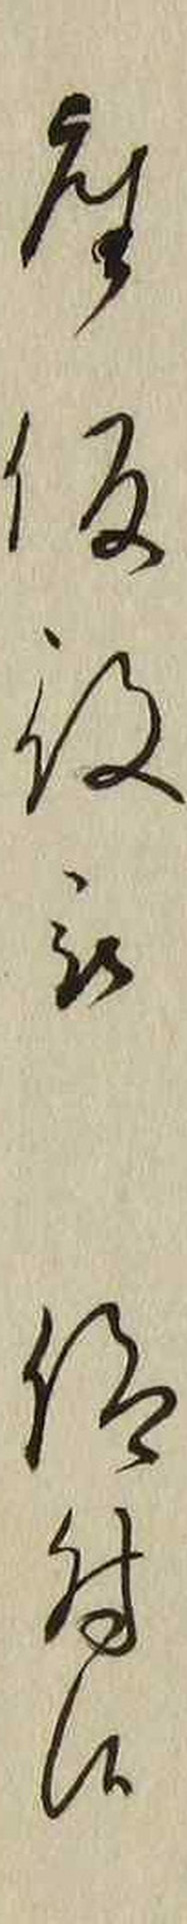座仮役被仰付候
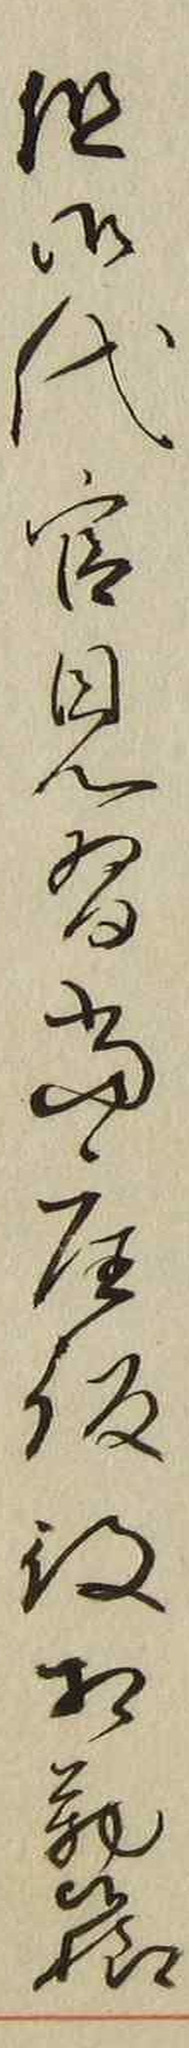但御代官見習当座仮役相勤候様
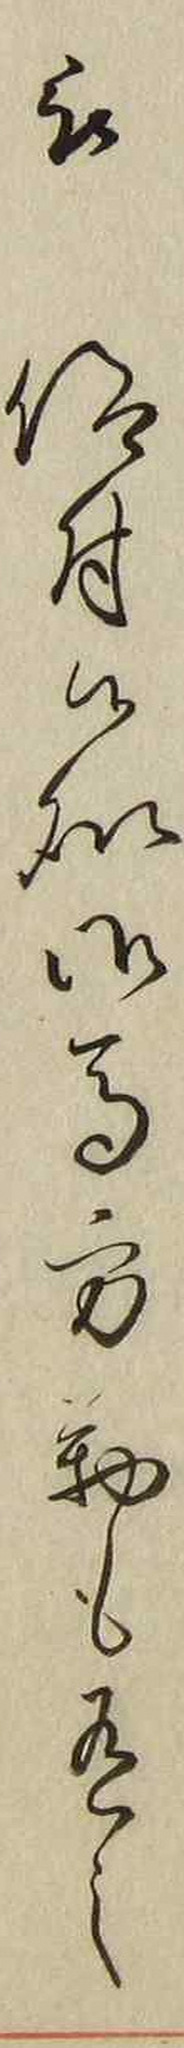被仰付候処御馬方勤も有之

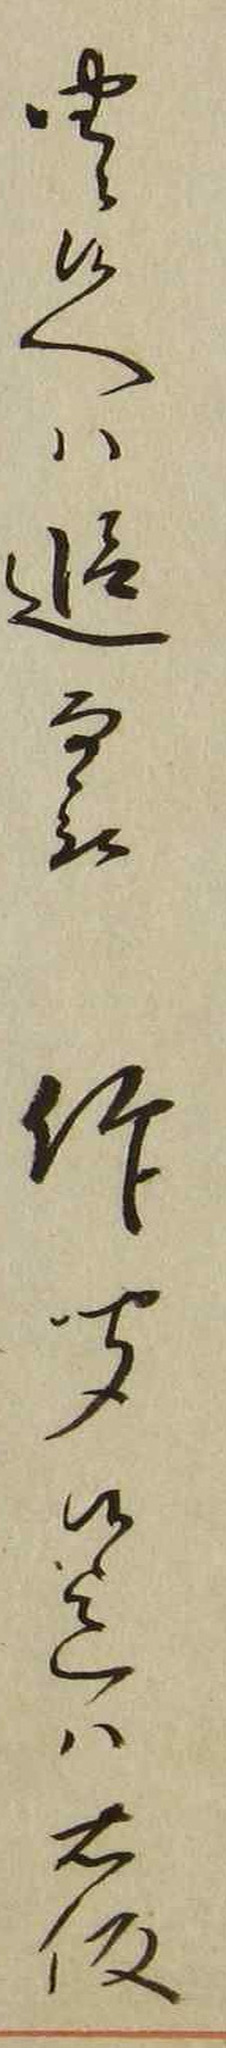由に候へは追而被仰聞候迄は右仮
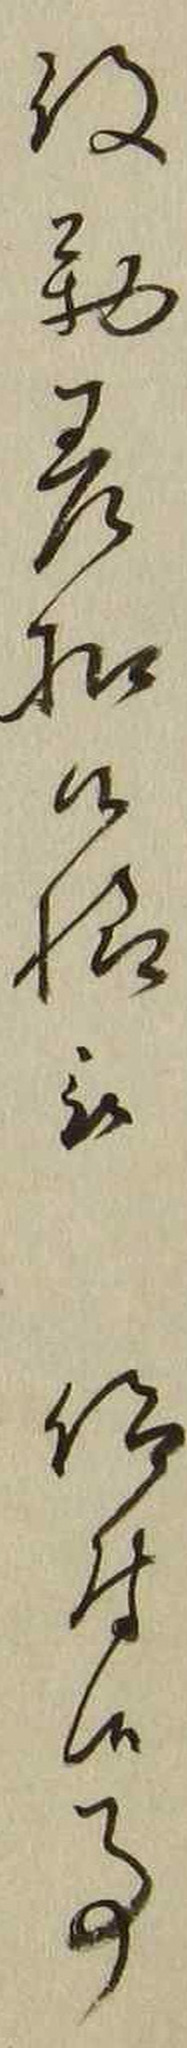役勤差控候様被仰付候事
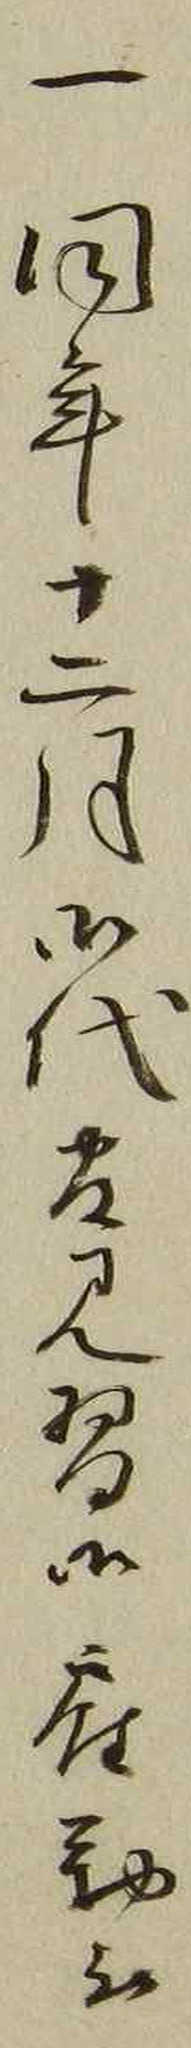一同年十二月御代官見習御雇勤被
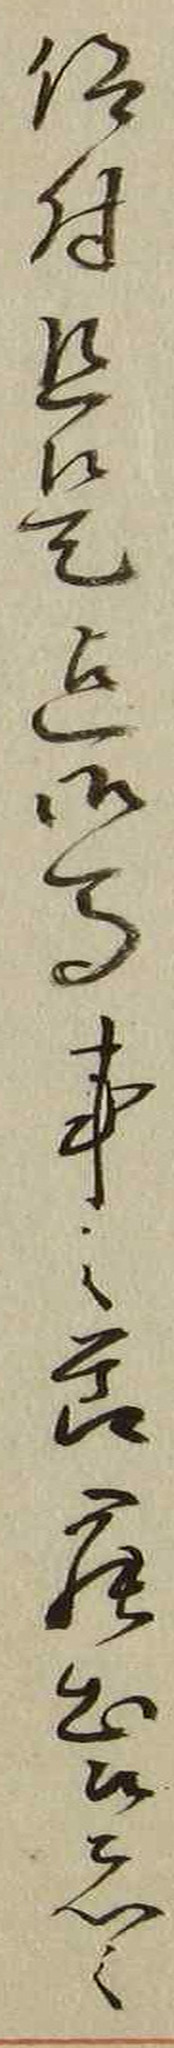仰付且是迄御馬事之節雇出候者之
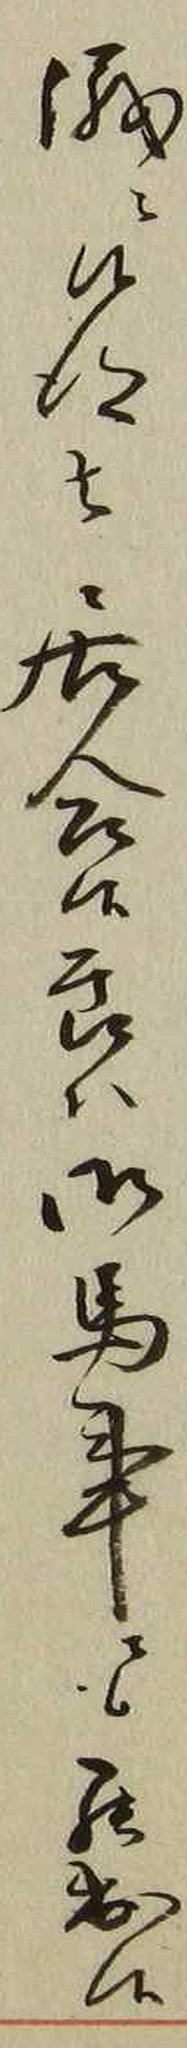儀に候得は居合候節は御馬事にも罷出候
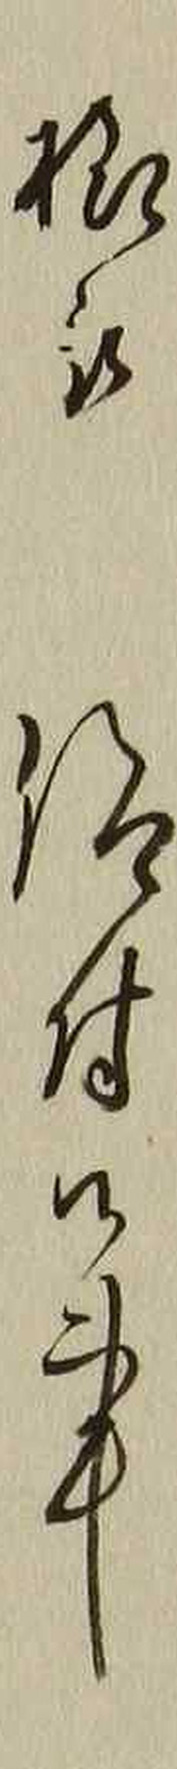様被仰付候事
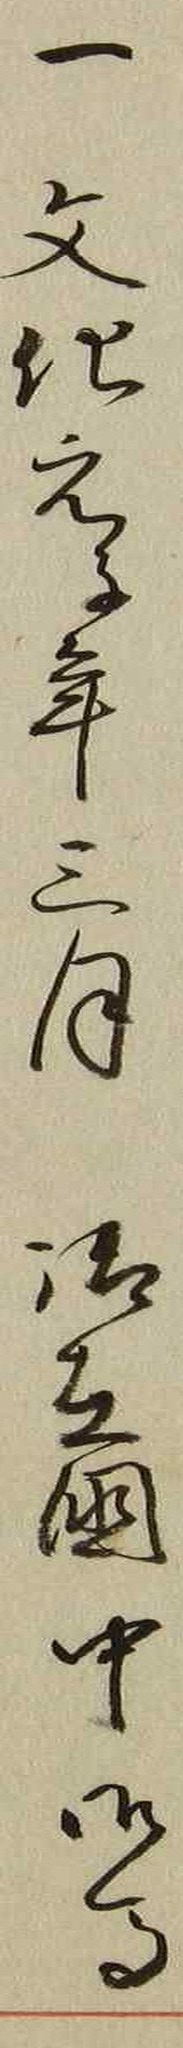一文化元子年三月御在国中御馬
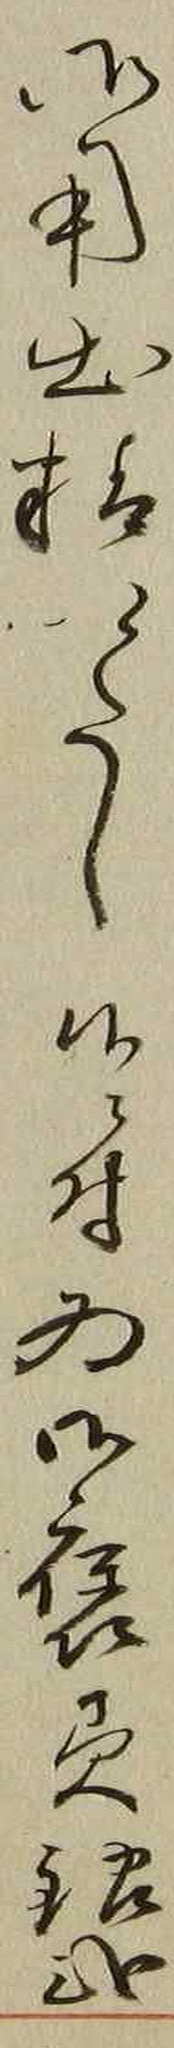御用出精いたし候ニ付為御褒美銀弐
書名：諸士系譜　巻之3　い之部3
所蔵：会津若松市立会津図書館
